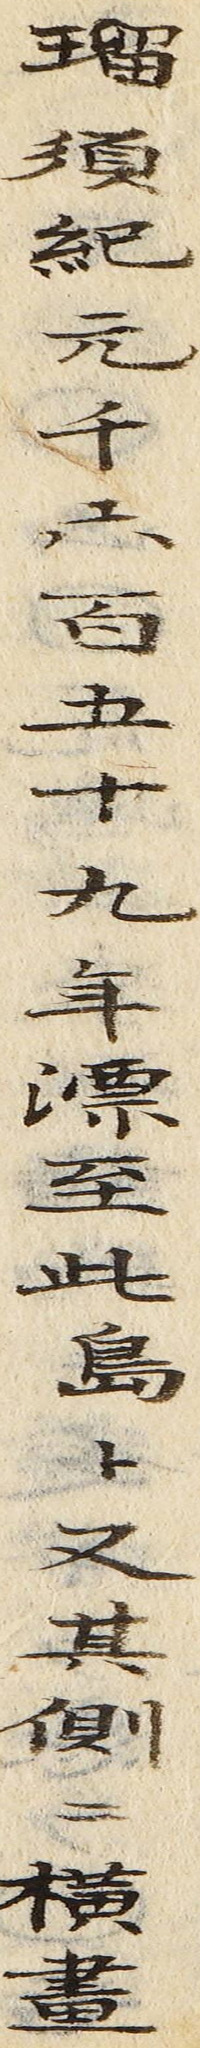瑠須紀元千六百五十九年漂至此島ト又其側ニ横画
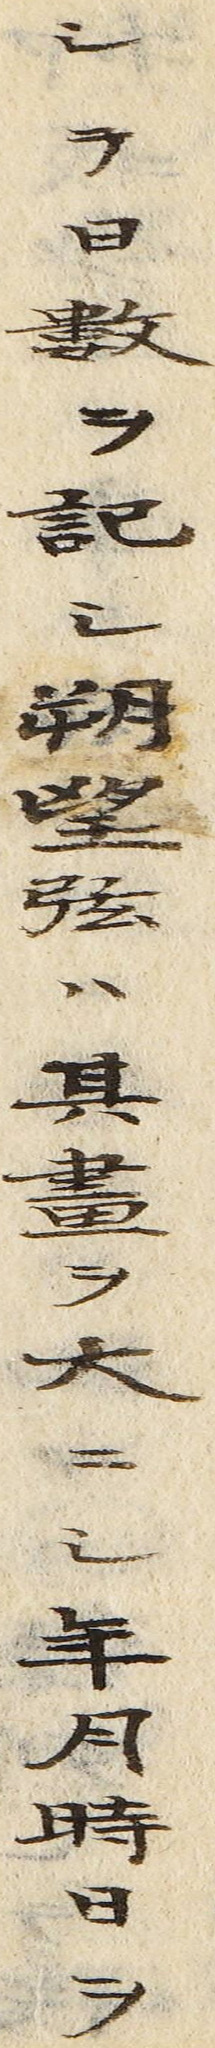シテ日数ヲ記シ朔望弦ハ其画ヲ大ニシ年月時日ヲ
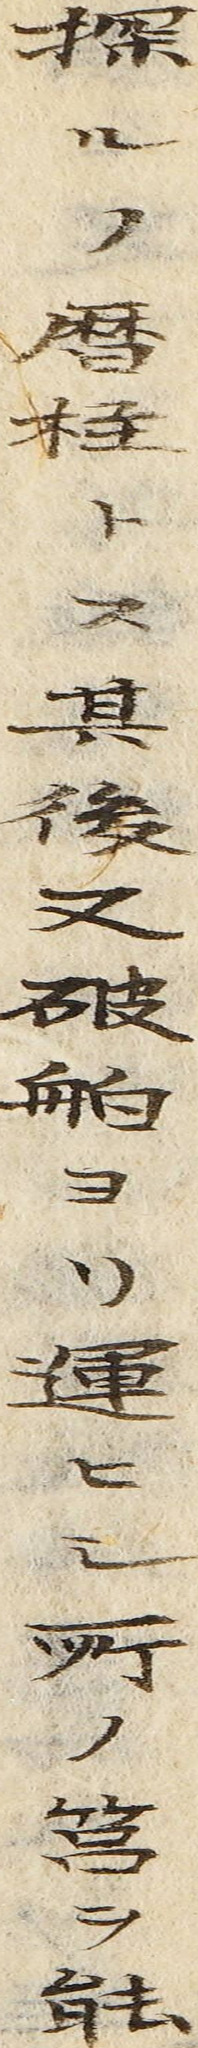探ルノ暦柱トス其後又破舶ヨリ運ヒシ所ノ筥ヲ能
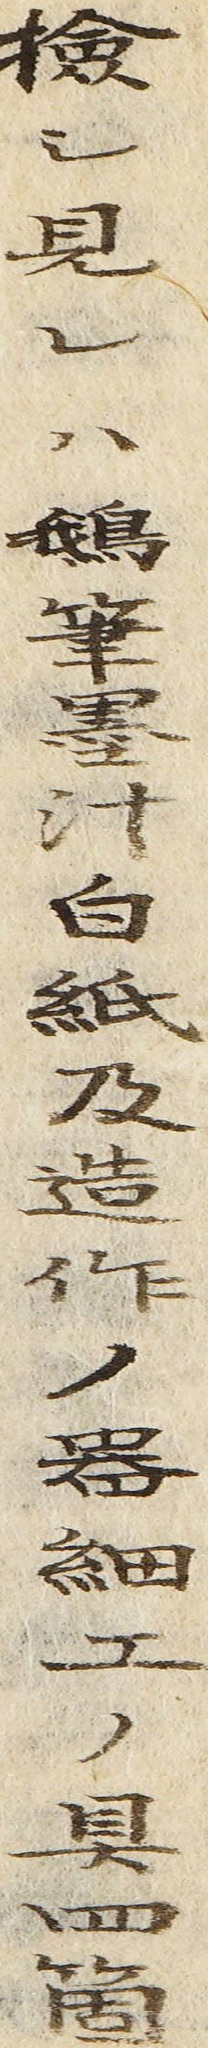撿シ見レハ鵝筆墨汁白紙及造作ノ器細工ノ具四箇
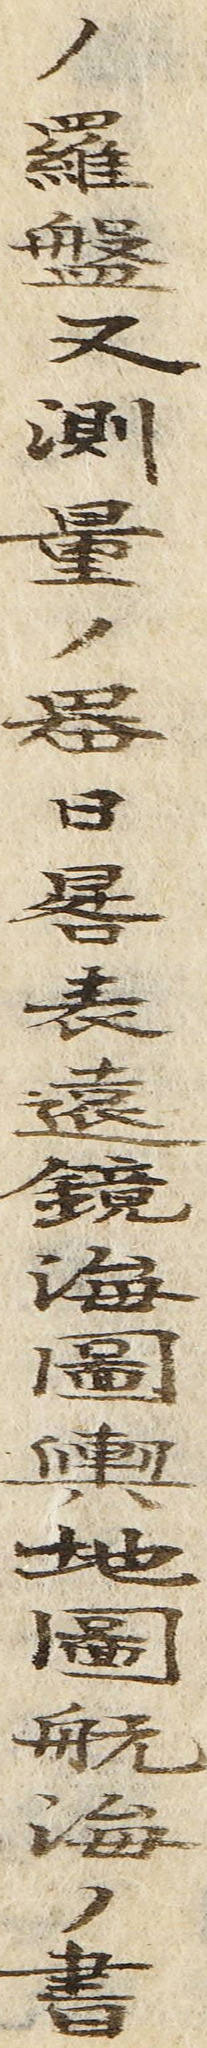ノ羅盤又測量ノ器日晷表遠鏡海図輿地図航海ノ書
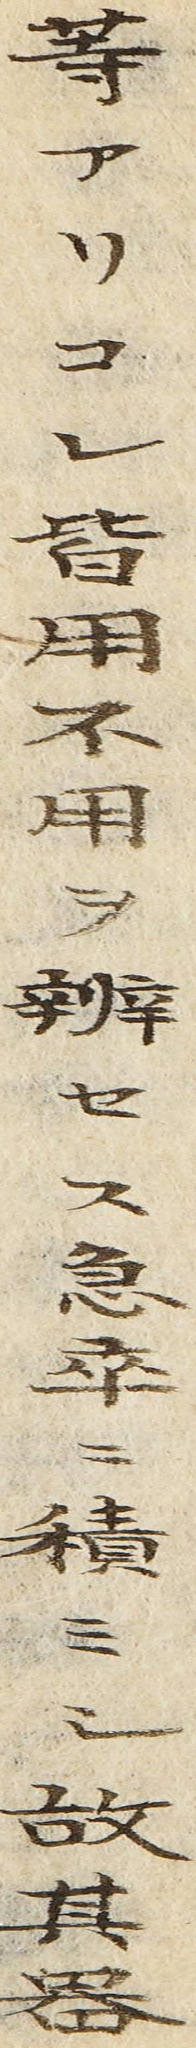等アリコレ皆用不用ヲ弁セス急卒ニ積ミシ故其器
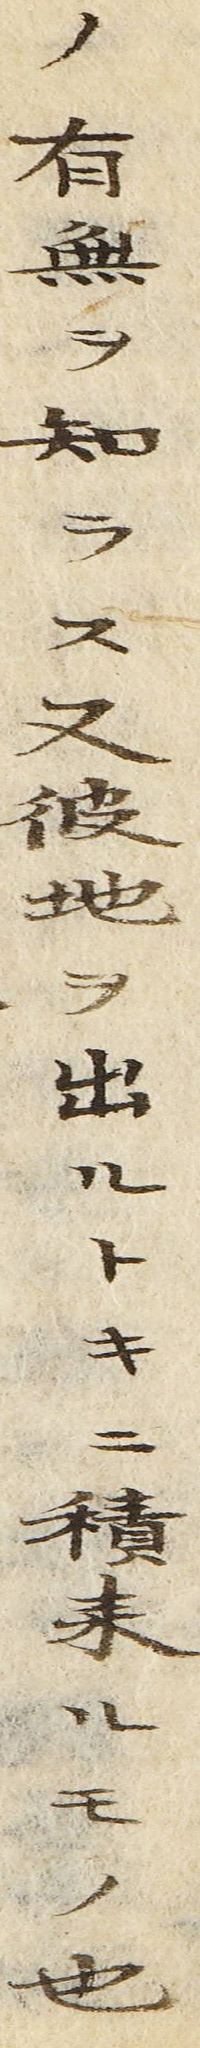ノ有無ヲ知ラス又彼地ヲ出ルトキニ積来ルモノ也
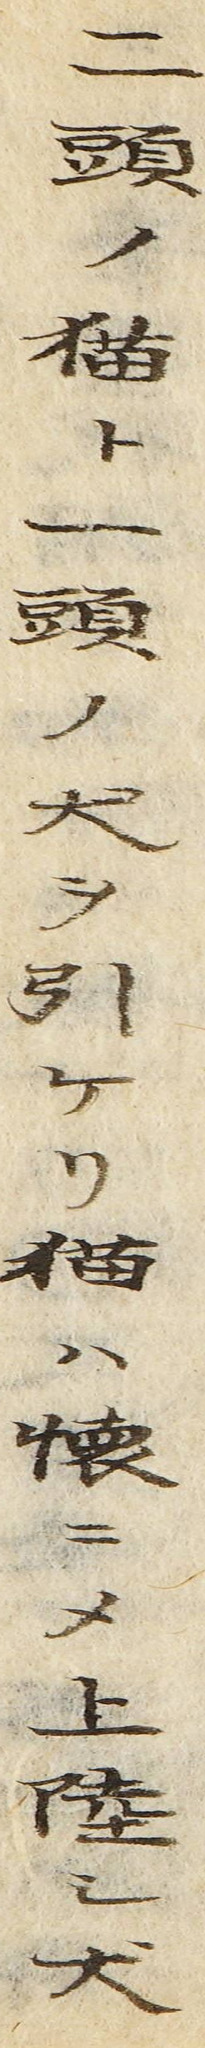二頭ノ猫ト一頭ノ犬ヲ引ケリ猫ハ懐ニシテ上陸シ犬
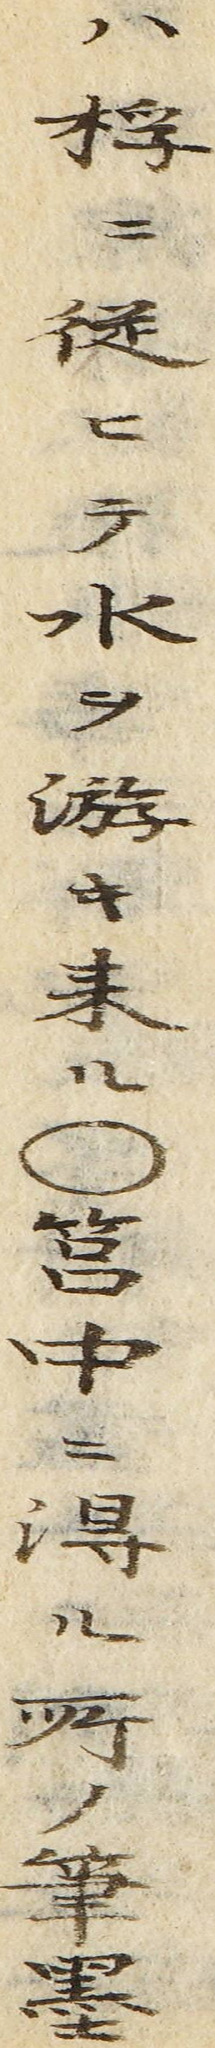ハ桴ニ従ヒテ水ヲ游キ来ル◯筥中ニ得ル所ノ筆墨

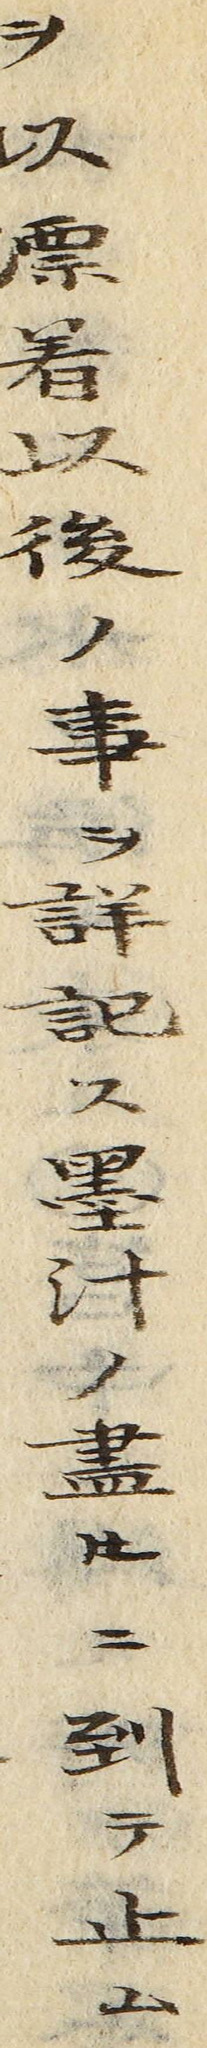ヲ以漂着以後ノ事ヲ詳記ス墨汁ノ尽ルニ到テ止ム
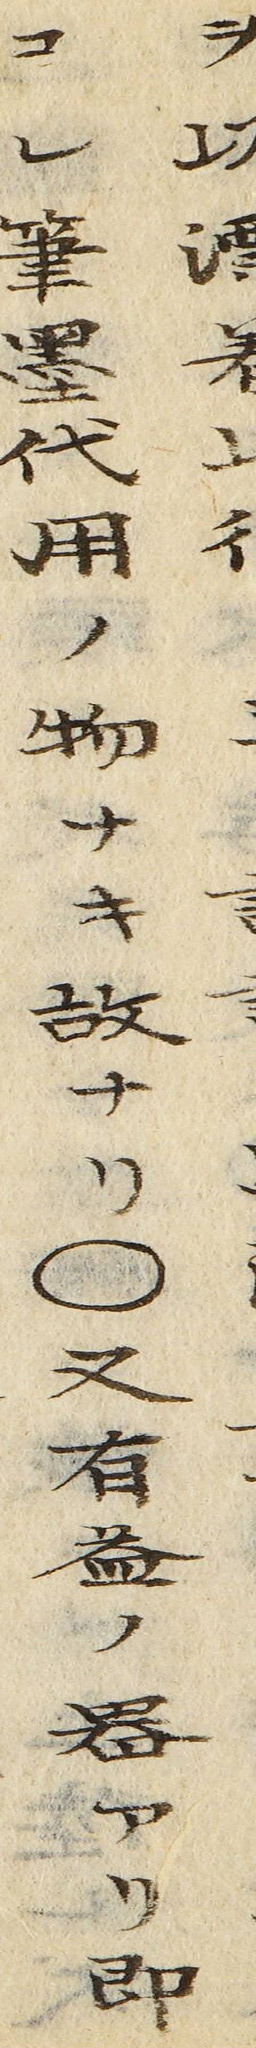コレ筆墨代用ノ物ナキ故ナリ◯又有益ノ器アリ即
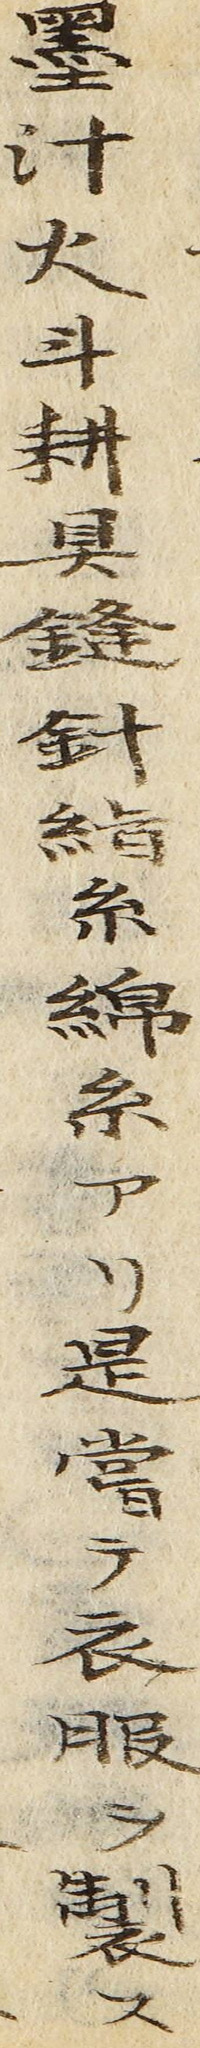墨汁火斗耕具鏠針絹糸綿糸アリ是嘗テ衣服ヲ製ス
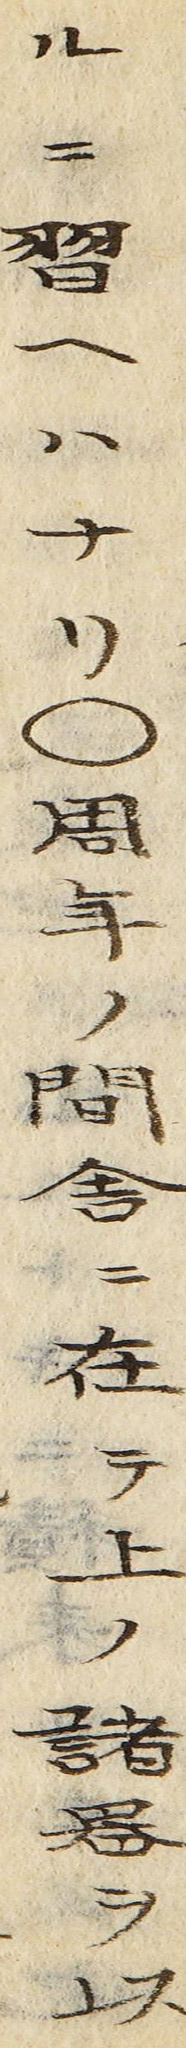ルニ習ヘハナリ◯周年ノ間舎ニ在テ上ノ諸器ヲ以
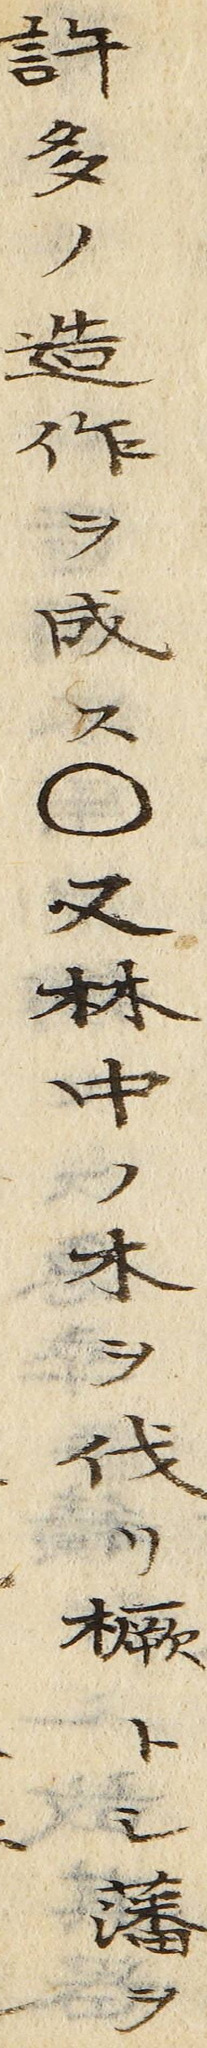許多ノ造作ヲ成ス◯又林中ノ木ヲ伐リ橛トシ藩ヲ
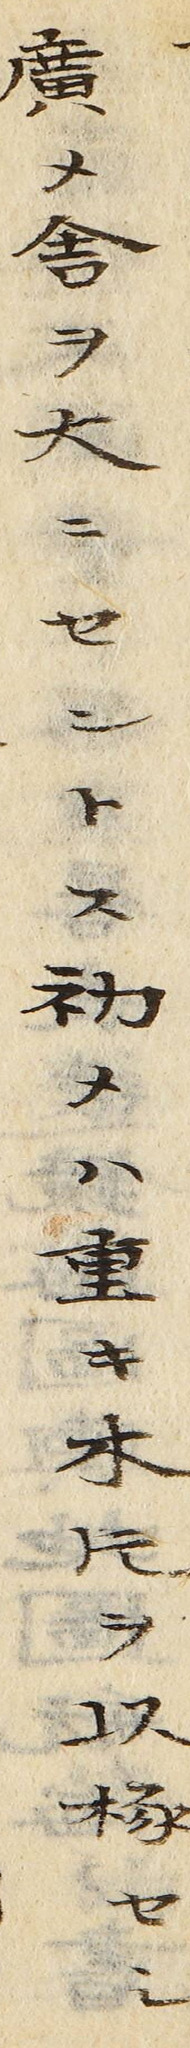広メ舎ヲ大ニセントス初メハ重キ木片を以椽セシ
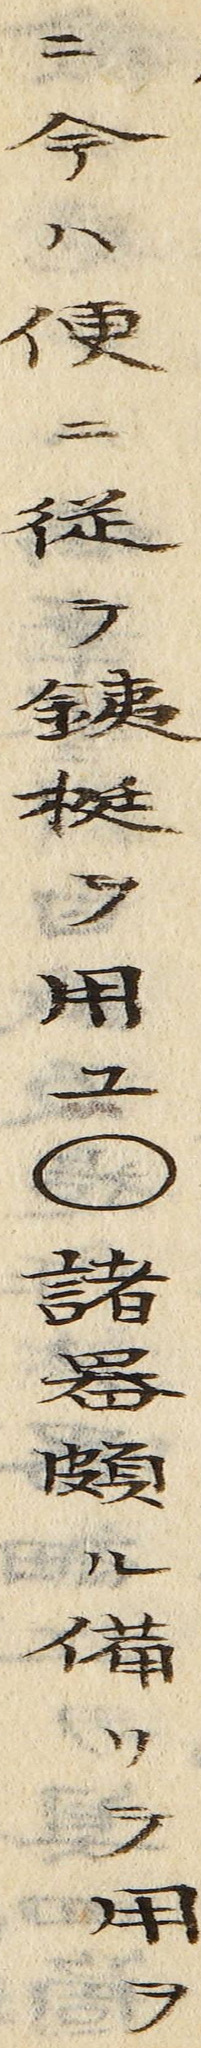ニ今ハ便ニ従テ鉄梃ヲ用ユ◯諸器頗ル備リテ用ヲ
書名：漂流紀事
